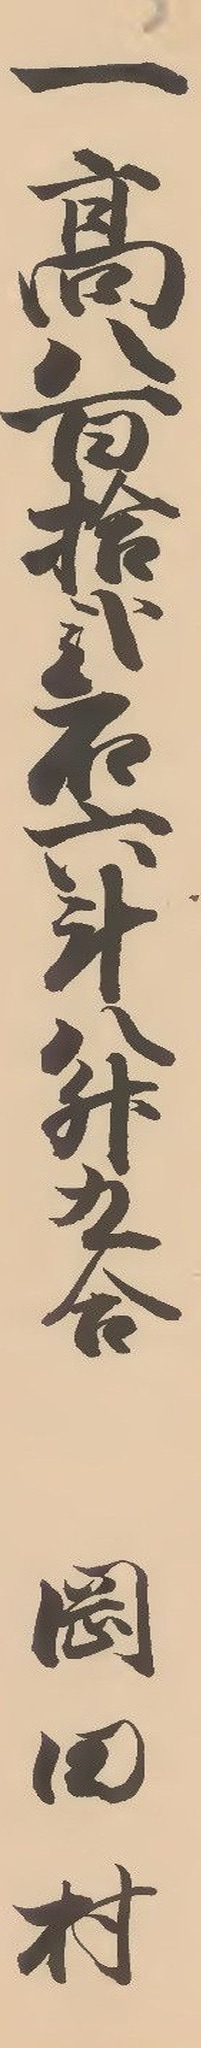一高八百拾弐石六斗八升九合岡田村
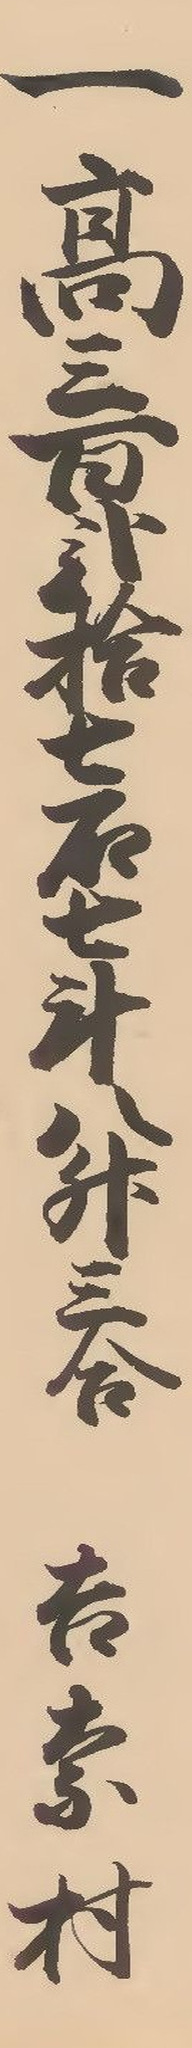一高三百弐拾七石七斗八升三合吉奈村

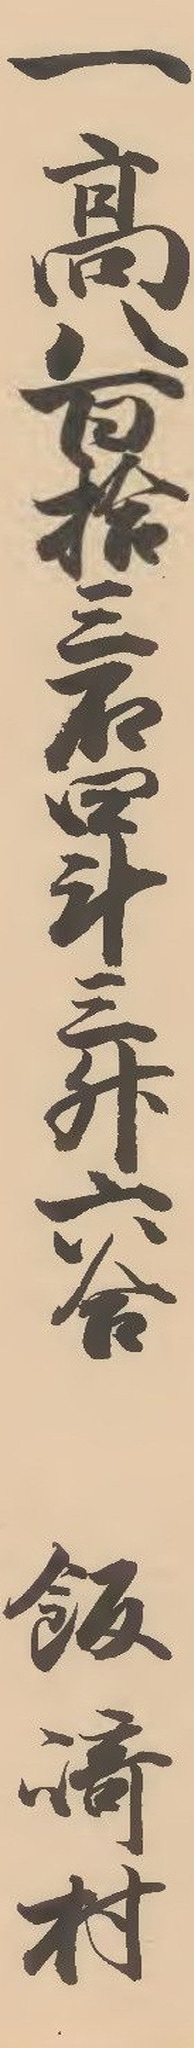一高八百拾三石四斗三升六合飯崎村
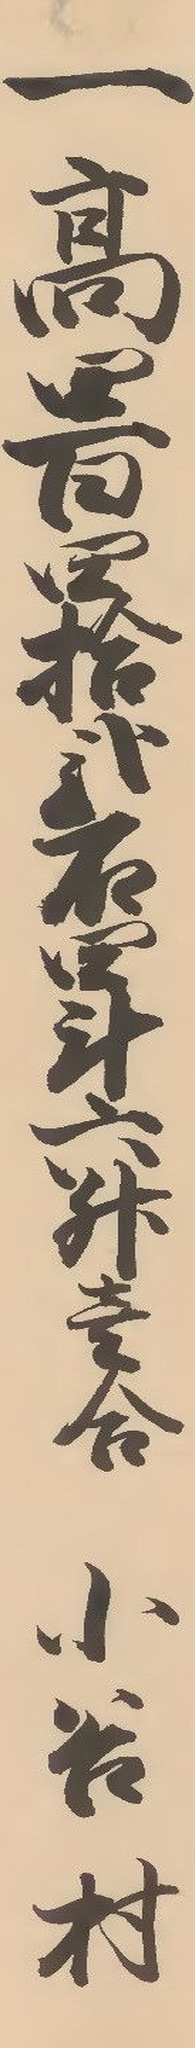一高四百四拾弐石四斗六升壱合小谷村
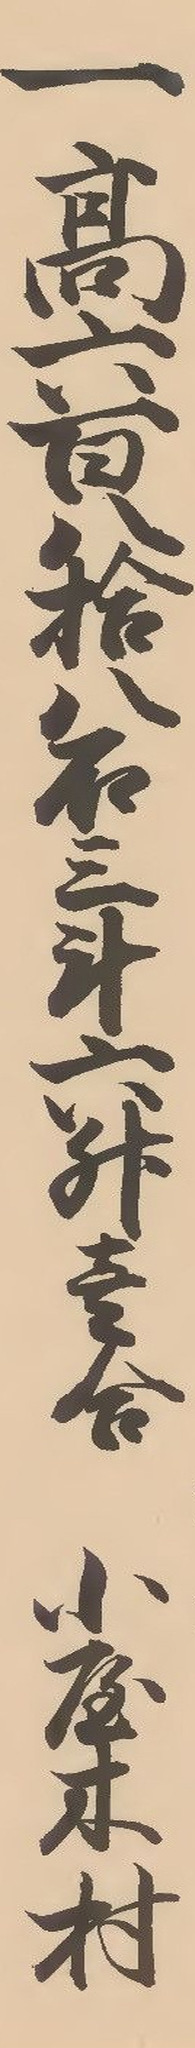一高六百八拾八石三斗六升壱合小屋木村
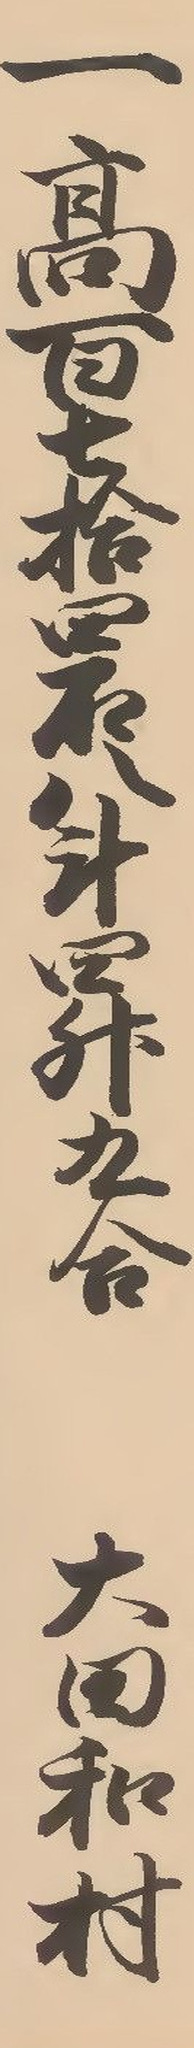一高百七拾四石八斗四升九合大田和村
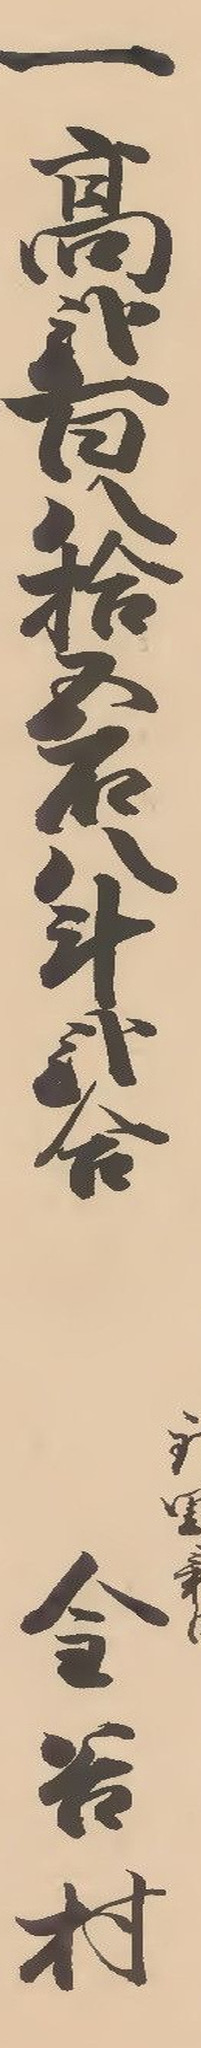一高弐百八拾五石八斗弐合金谷村
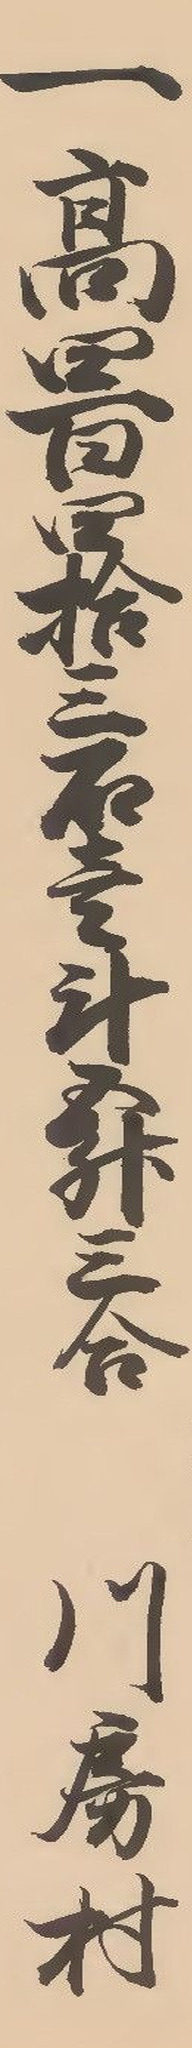一高四百四拾三石壱斗五升三合川房村
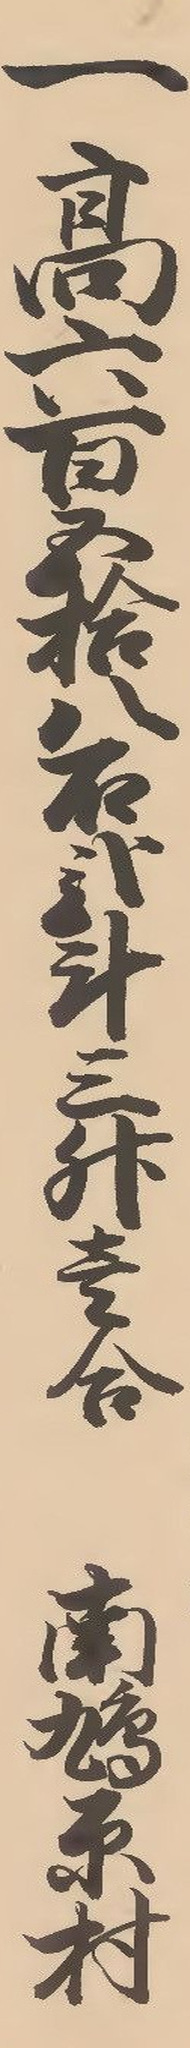一高六百五拾八石弐斗三升壱合南鳩原村

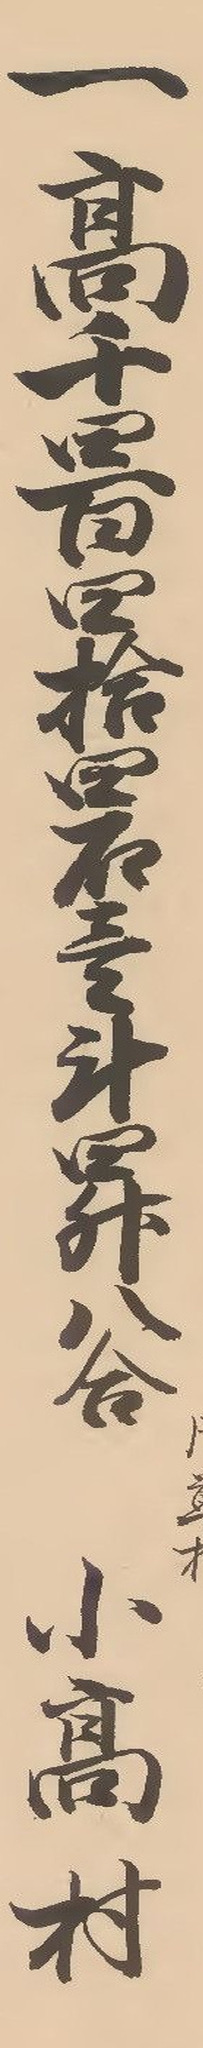一高千四百四拾四石壱斗四升八合小高村
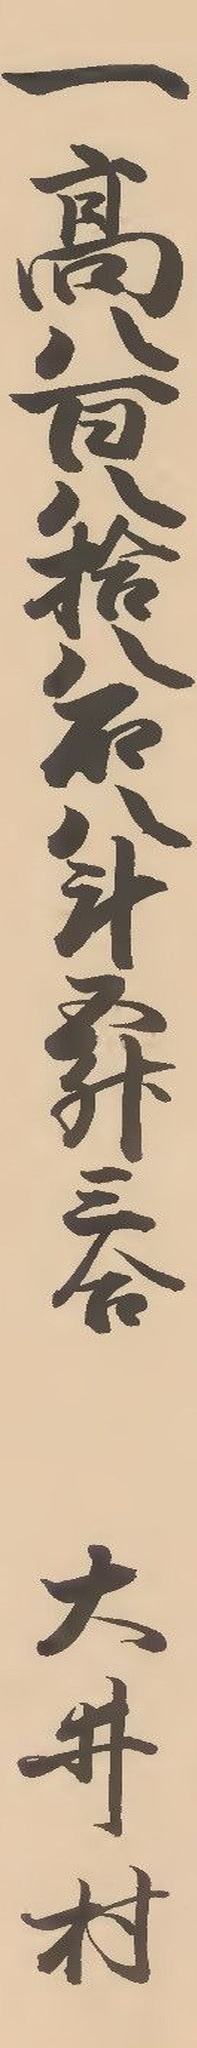一高八百八拾八石八斗五升三合大井村
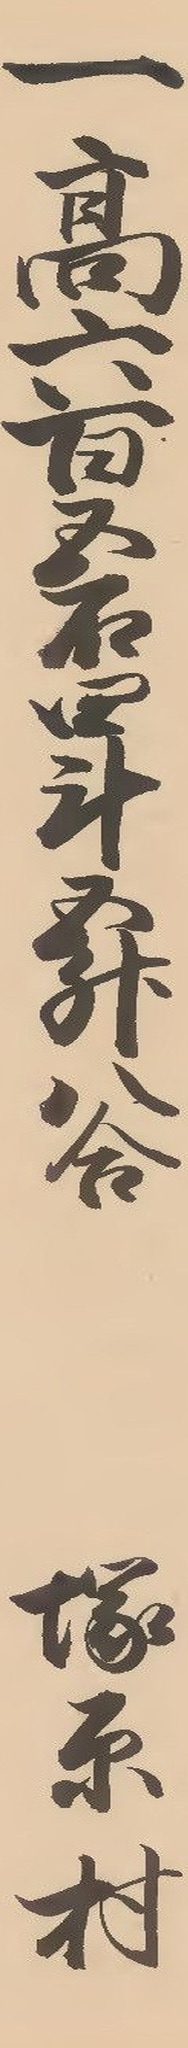一高六百五石四斗五升八合塚原村
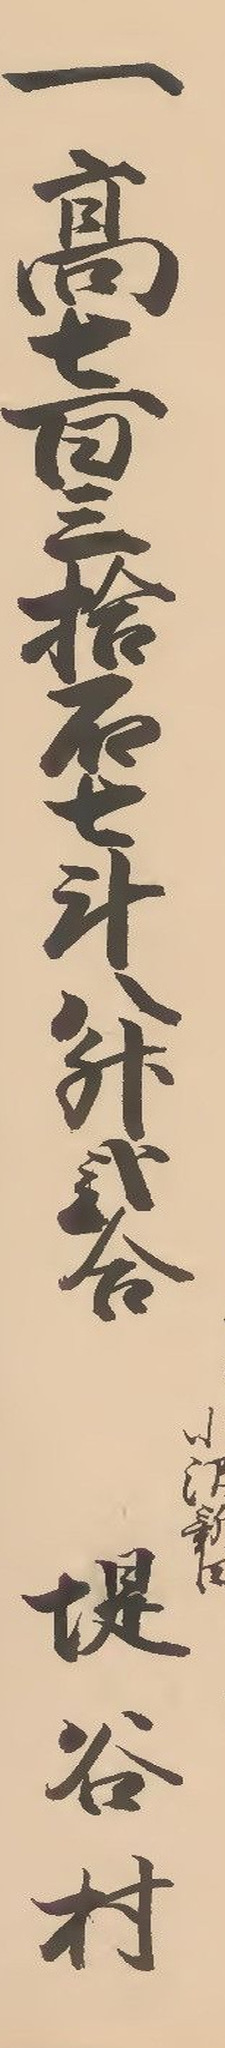一高七百三拾石七斗八升弐合堤谷村
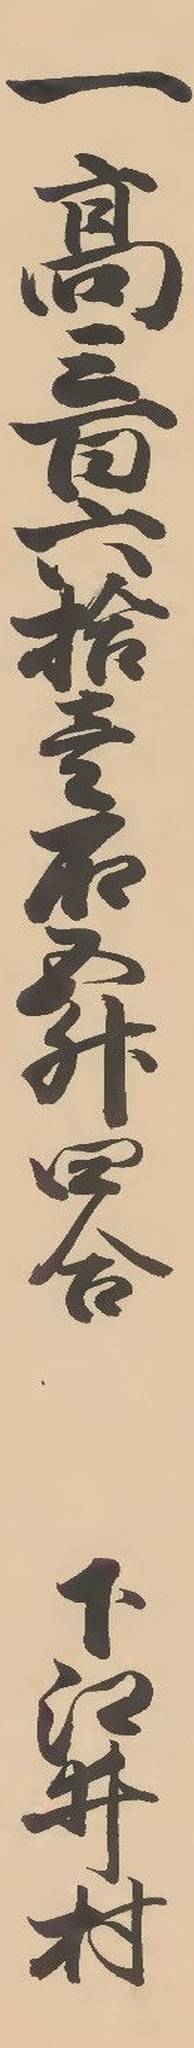一高三百六拾壱石五升四合下江井村
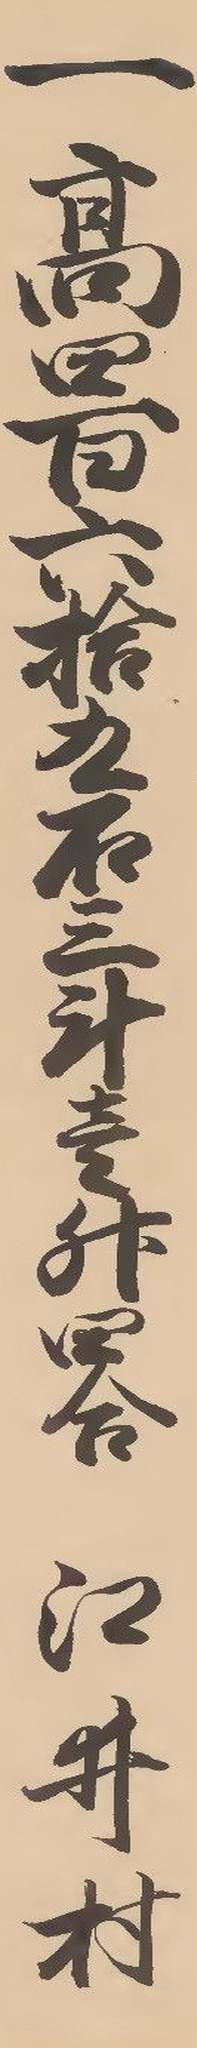一高四百六拾九石三斗壱升四合江井村
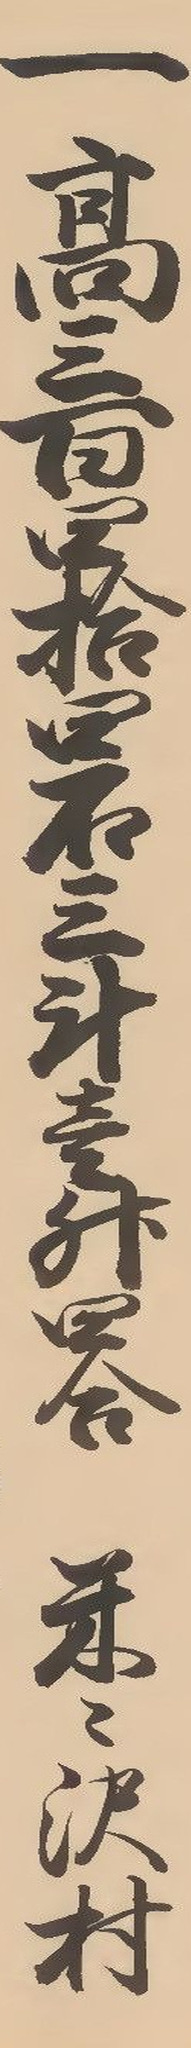一高三百四拾四石三斗壱升四合米々沢村
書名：陸奥国郷帳　３
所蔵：国立公文書館 National Archives of Japan
